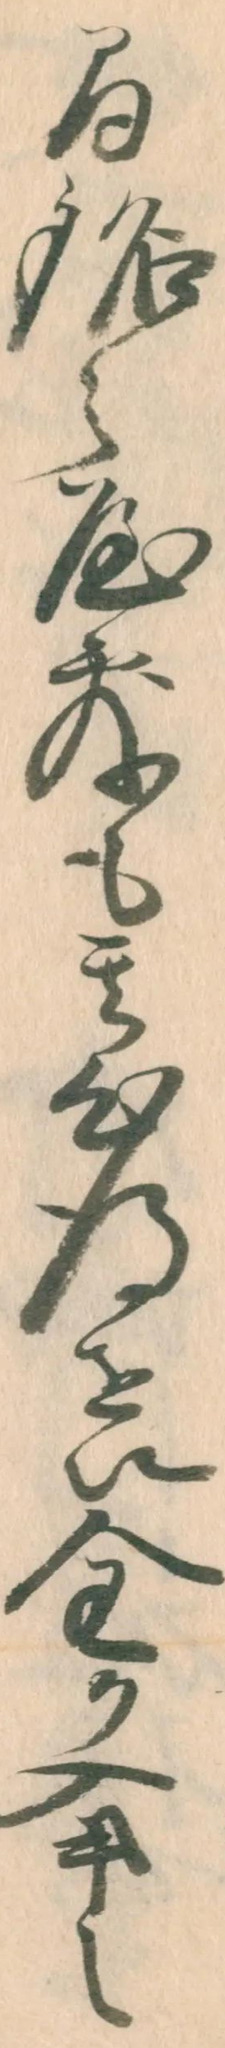間銘之屋敷も其心得を以全く入用之
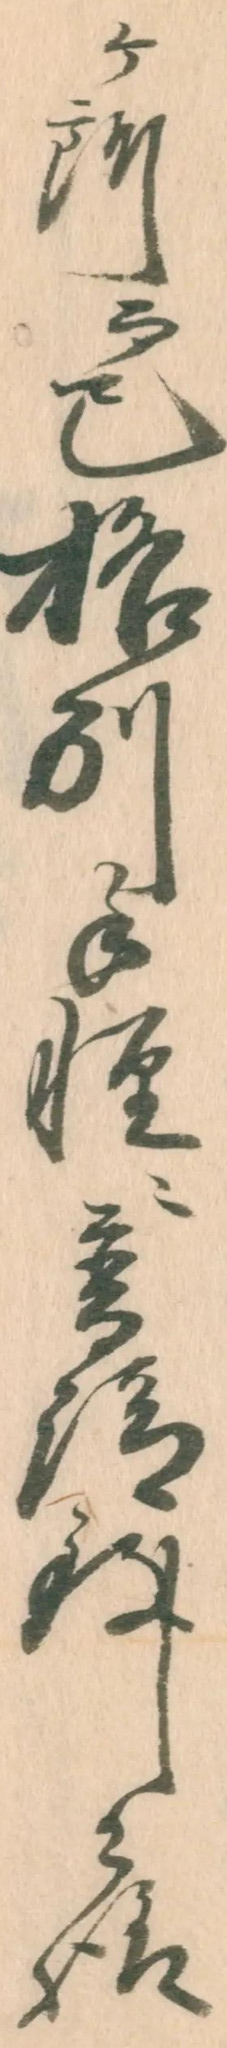ケ所而已格別手軽ニ普請致し候様
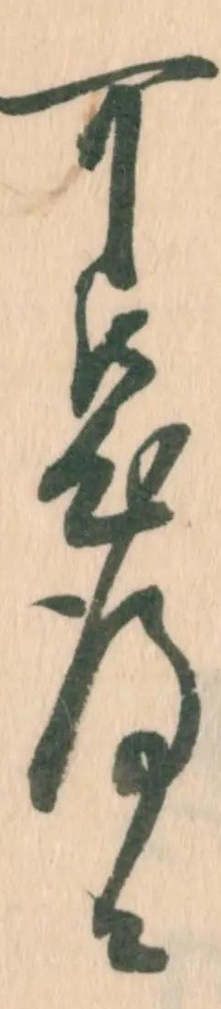可被心得候
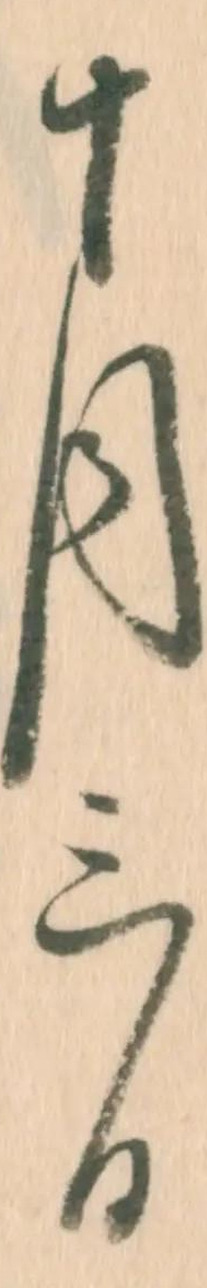十月三日
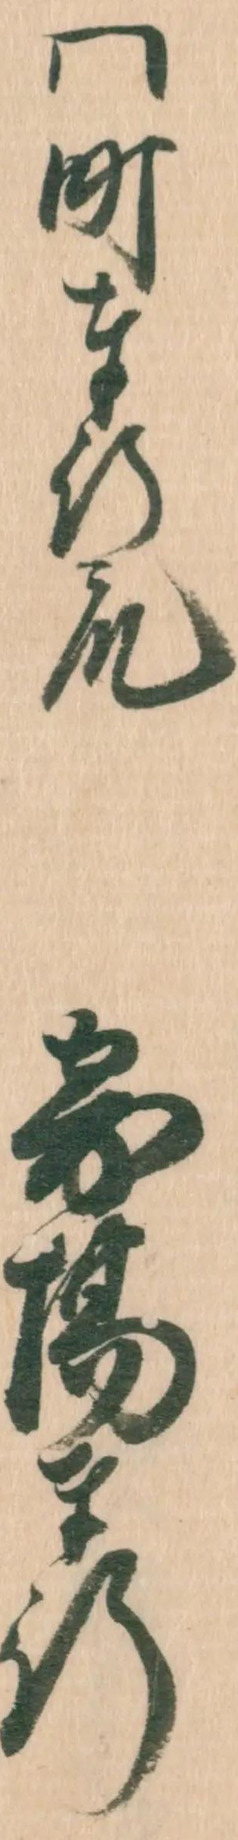│[町奉行衆寄場奉行
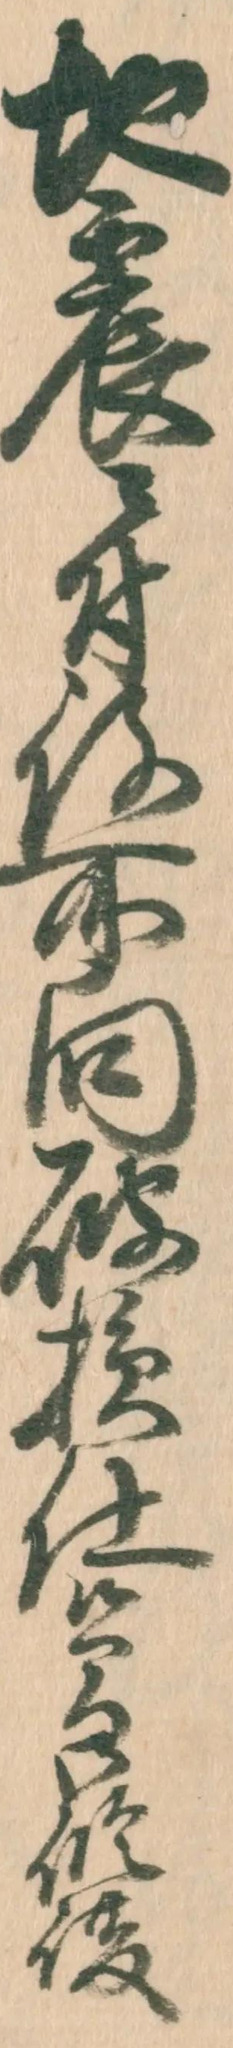地震ニ付役所向破損仕候間御修復
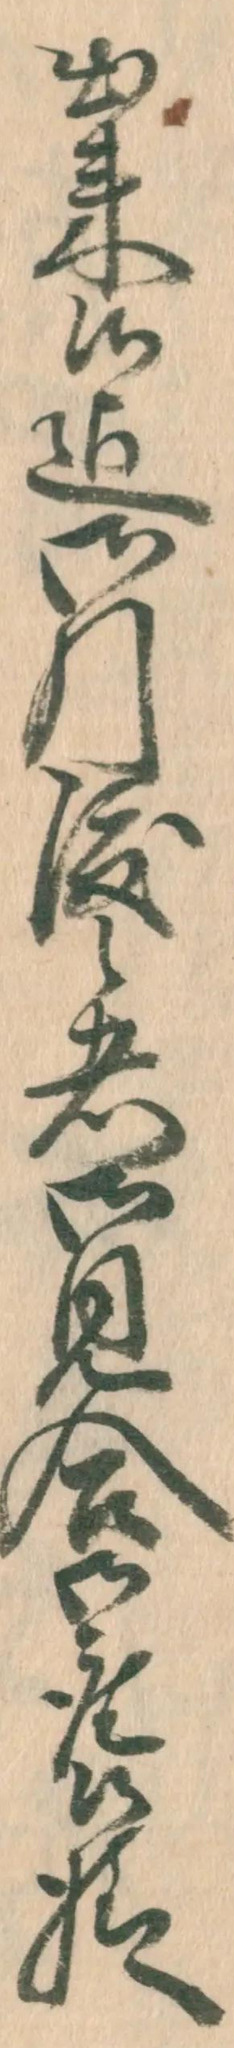出来候迄御引渡之者見合御座候様
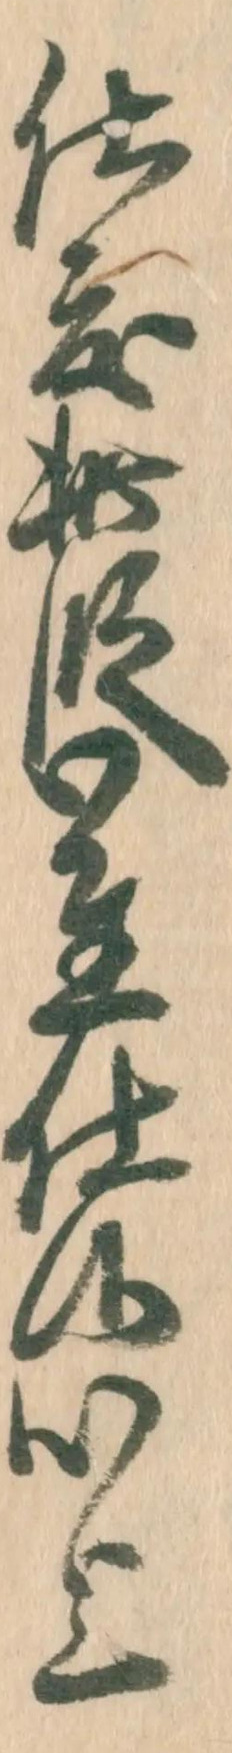仕度此段御達仕候以上

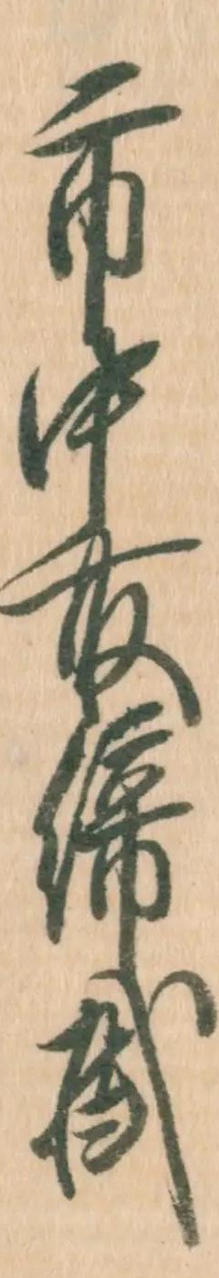市中取締掛
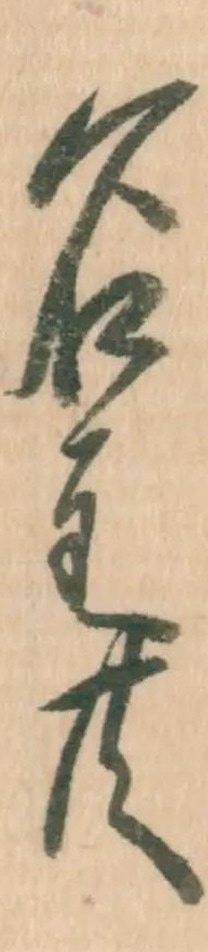名主共
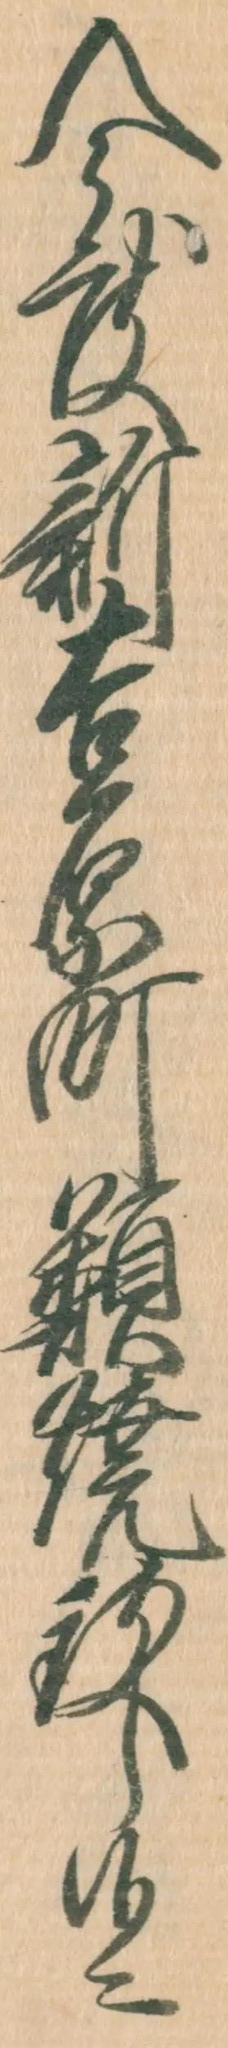今度新吉原町類焼致し候ニ
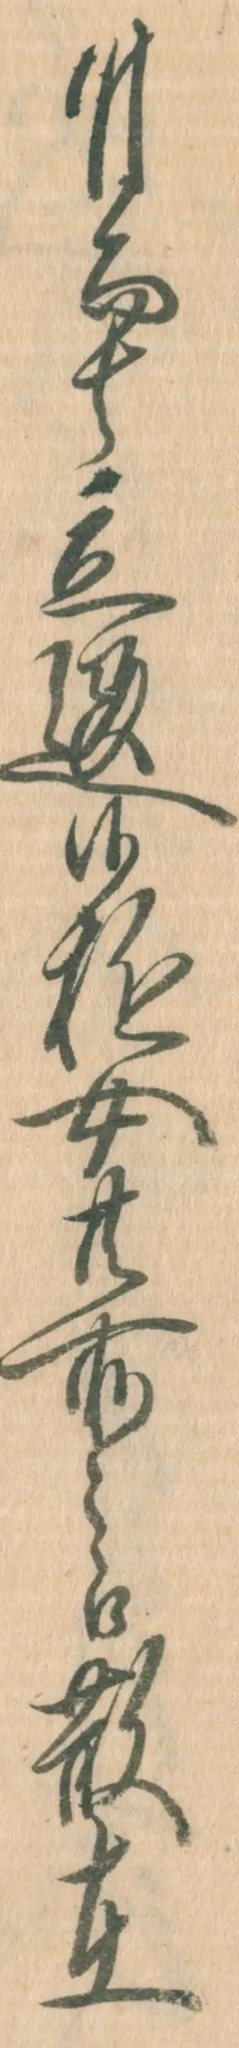付ては立退候遊女共所〻江散在
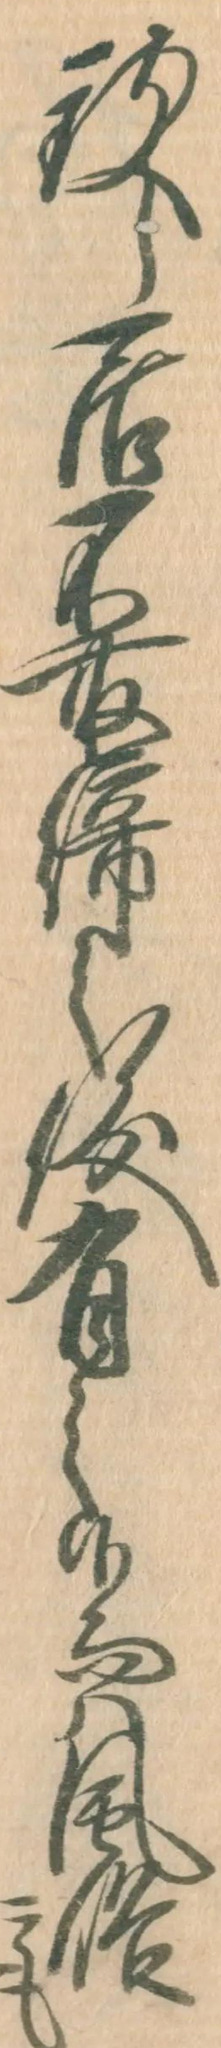致し居不取締之儀有之候てハ風俗ニも

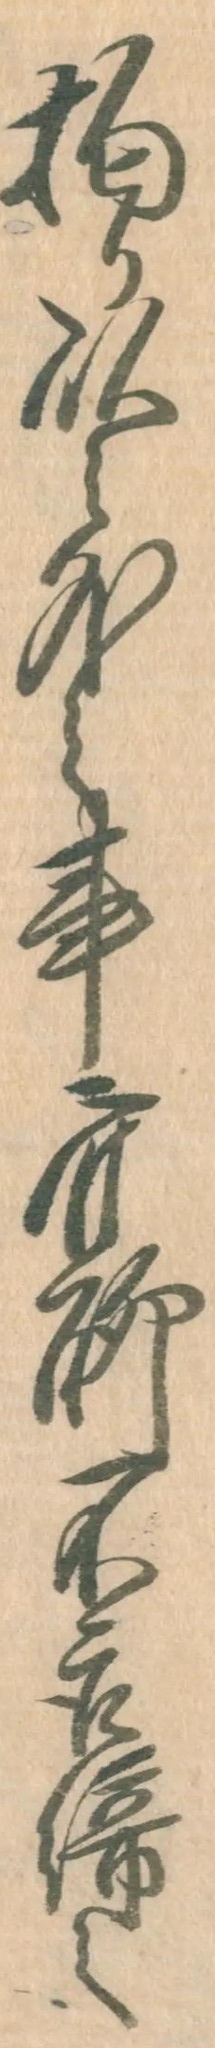拘り以之外之事ニ付聊不取締之
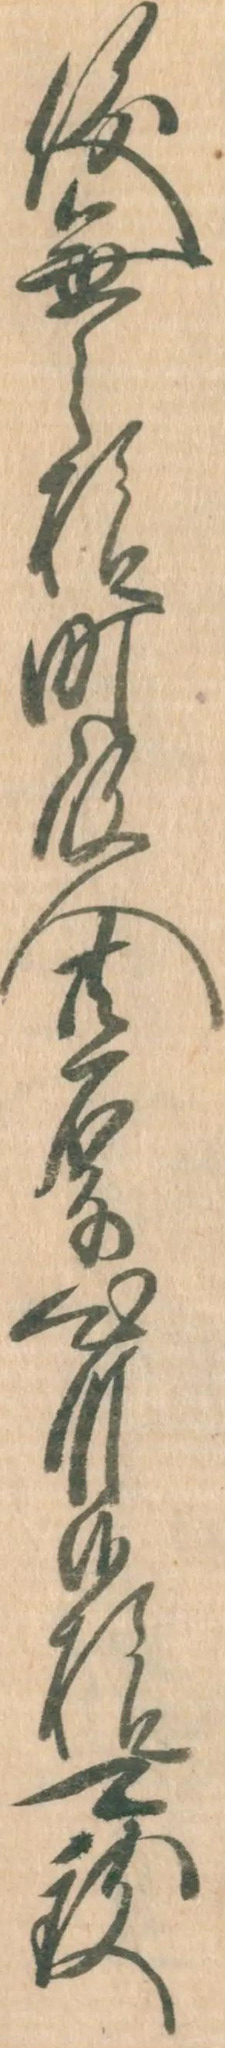儀無之様町役人共厚心付候様可致
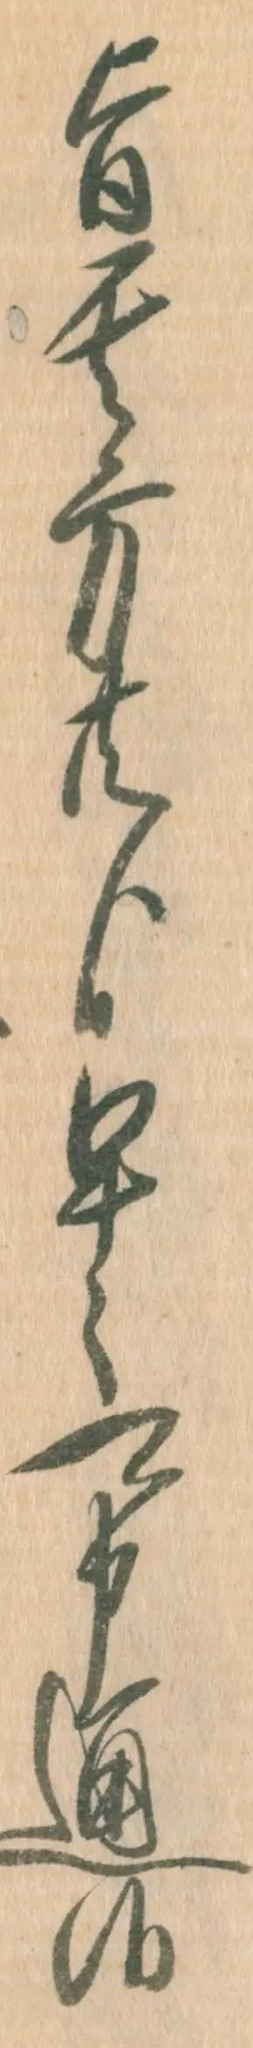旨其方共ゟ早〻可申通候
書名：地震災書留 2巻. [2] 内表紙に「地震一件　安政二卯年十月」とあり
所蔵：国立国会図書館 National Diet Library, JAPAN
